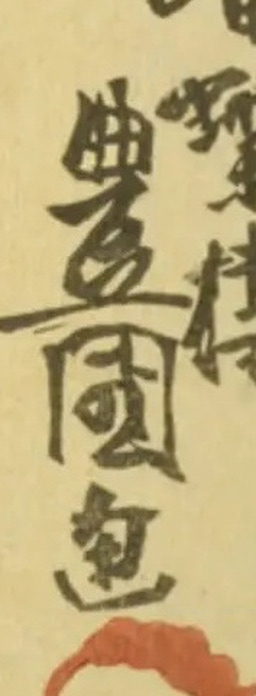豊国画
